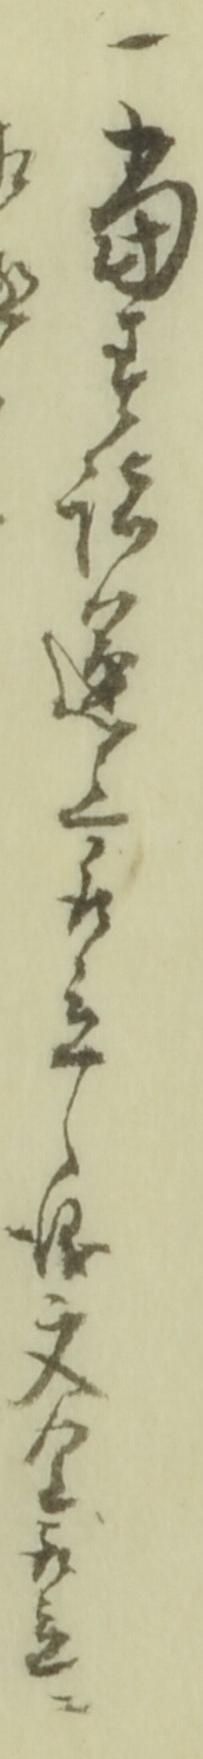一当春諸運上取立候儀文金取立
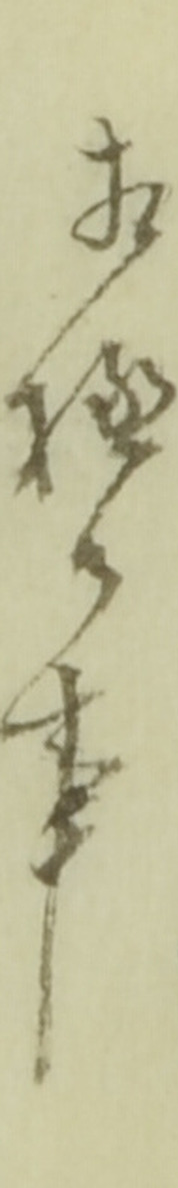相極候事
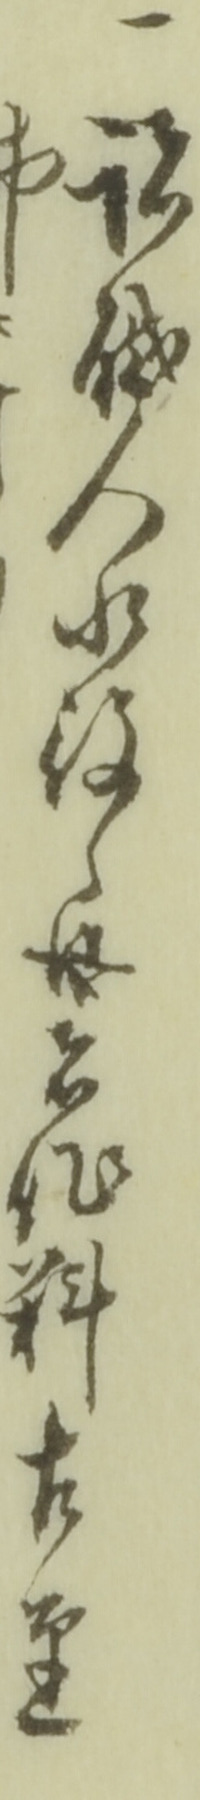一諸職人収役之冊者作料古達
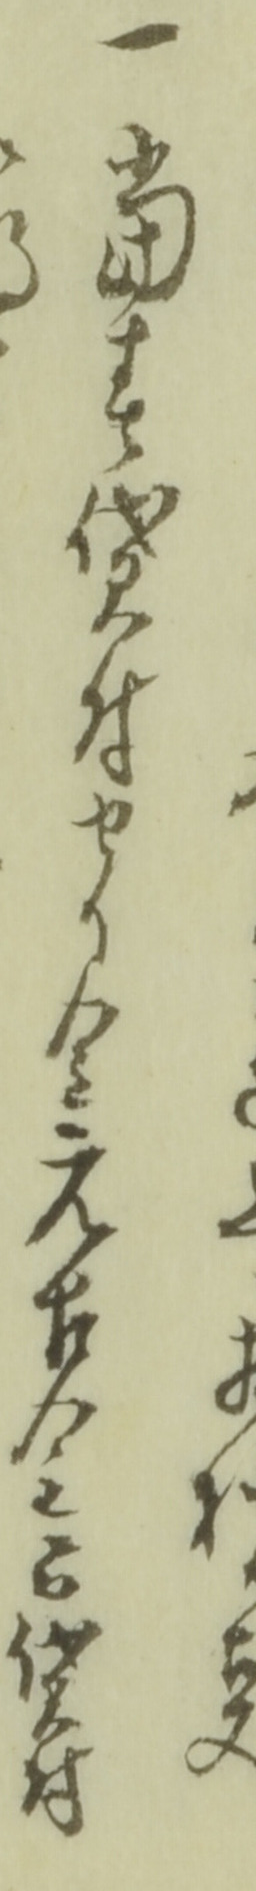一当春貸付セり金元古金二而貸付
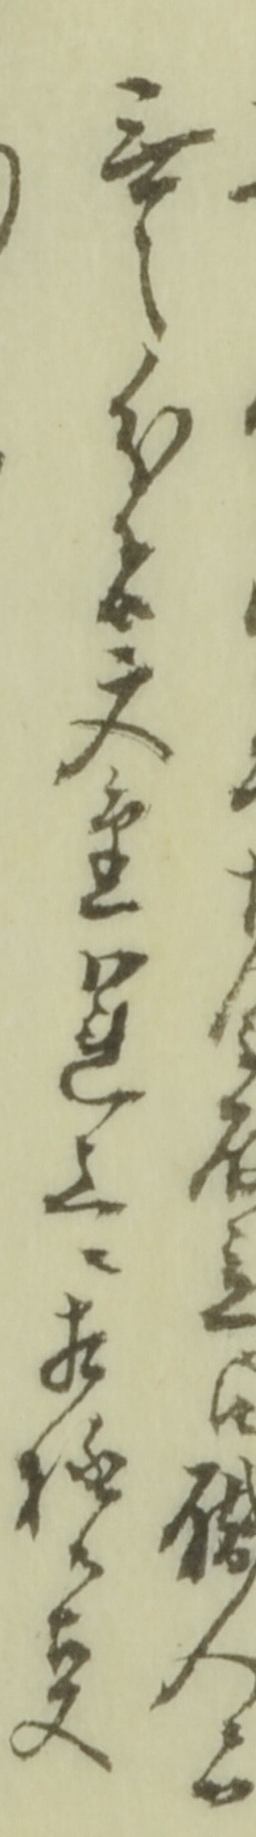無之分者受置運上二相極候事
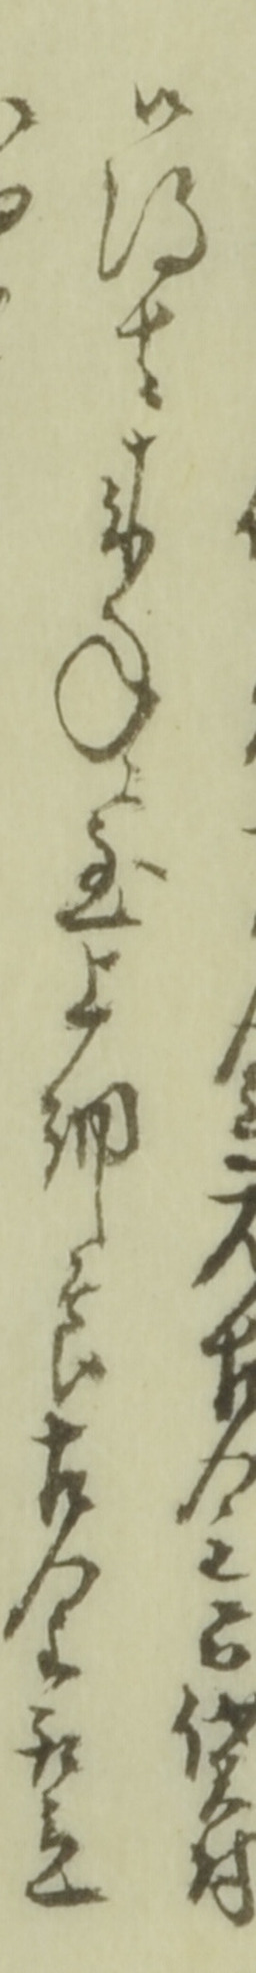候得共来年二至上納候節古金取立
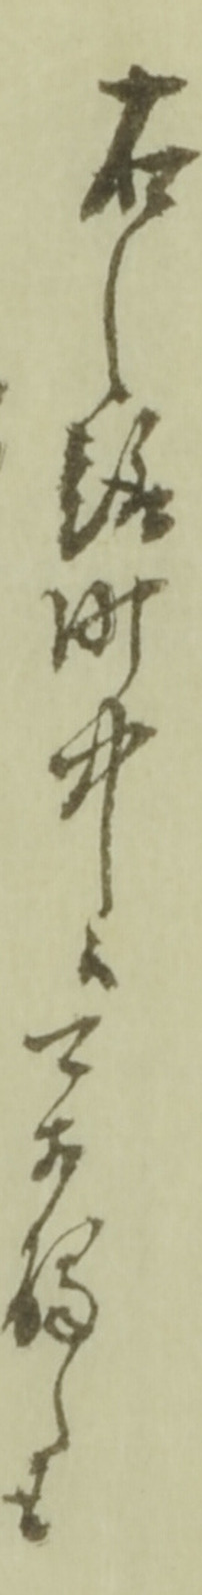右之趣町中え可相触候以上
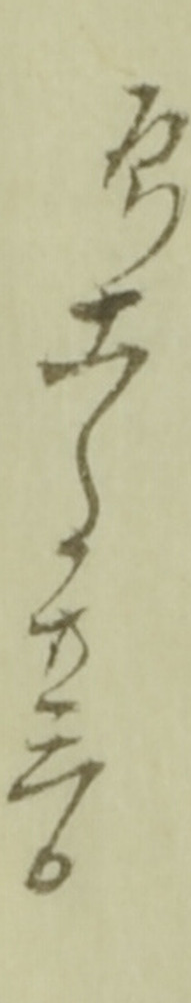辰十一月廿三日
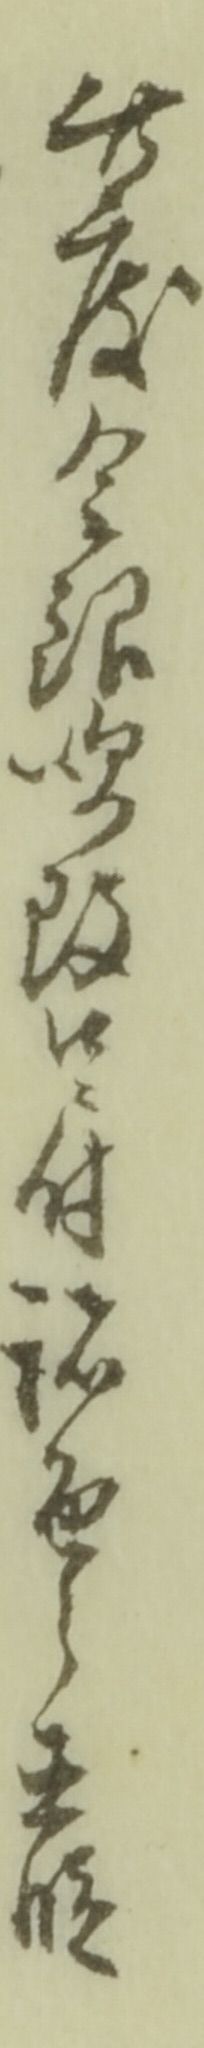此度金銀吹改候二付諸色之値段
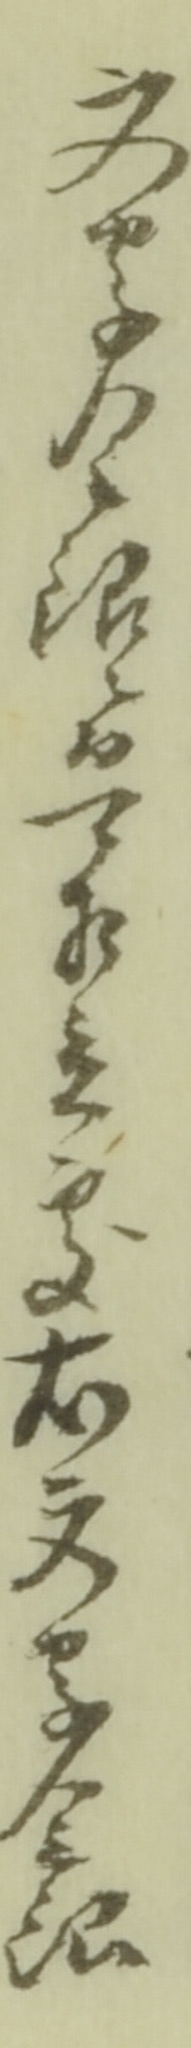文字金銀二而可相立處右文字金銀
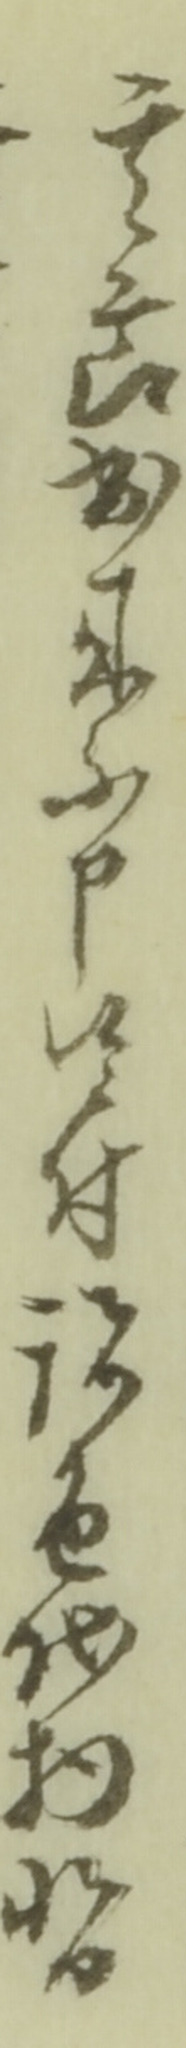其節出来不申候二付諸色代物替
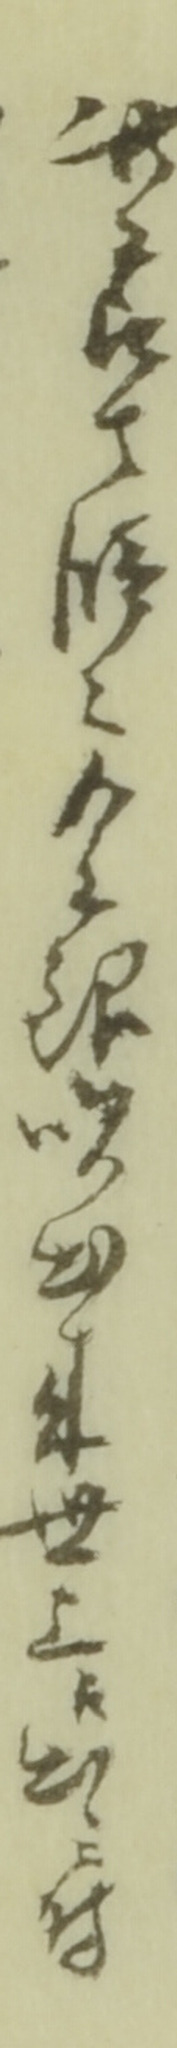此節者段々金銀吹出来世上二出候付
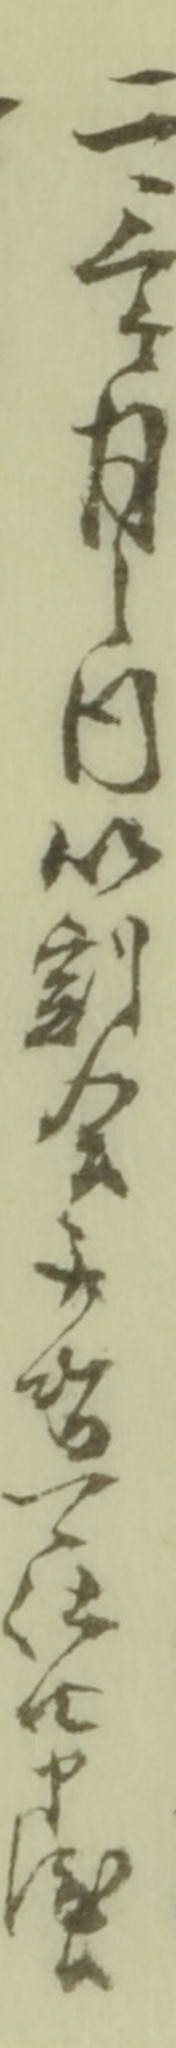二三ヶ月之内此割合取替可仕由申儀二
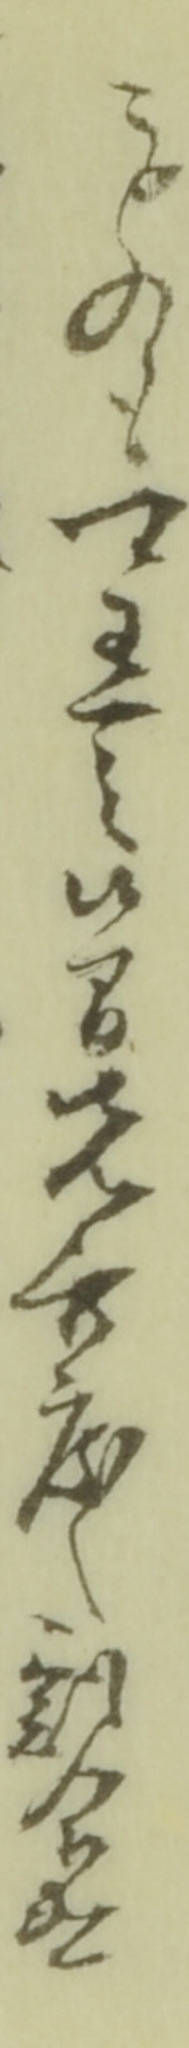ものも可有之候間先此度之割合替
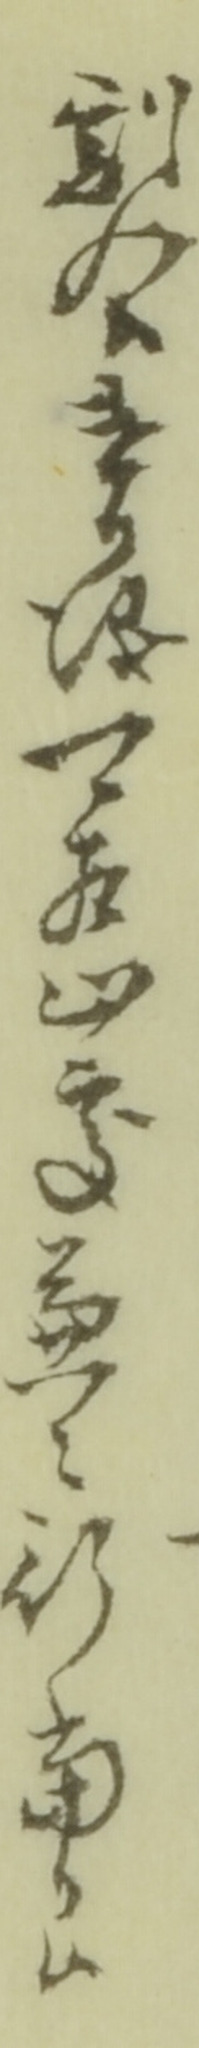割合遣候様可相正處兼而行当リ候
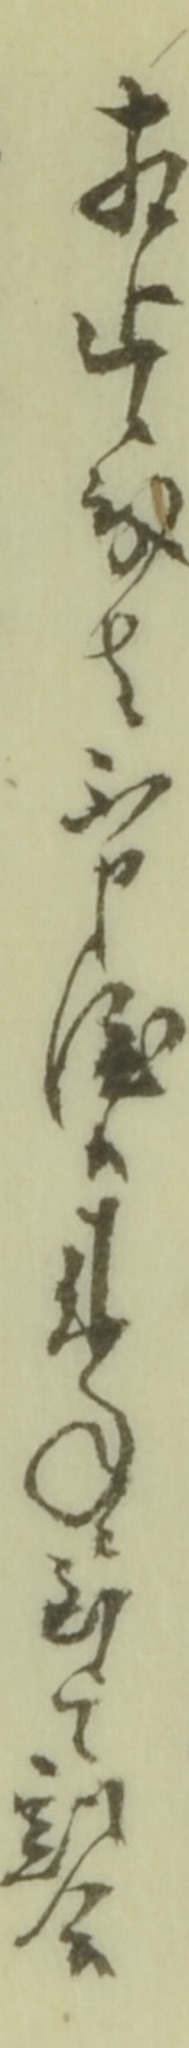相止候儀者不申渡候来年二至て割合
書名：御公儀様御領主様御触書控
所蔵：伊那市立高遠町図書館・合同会社AMANE
